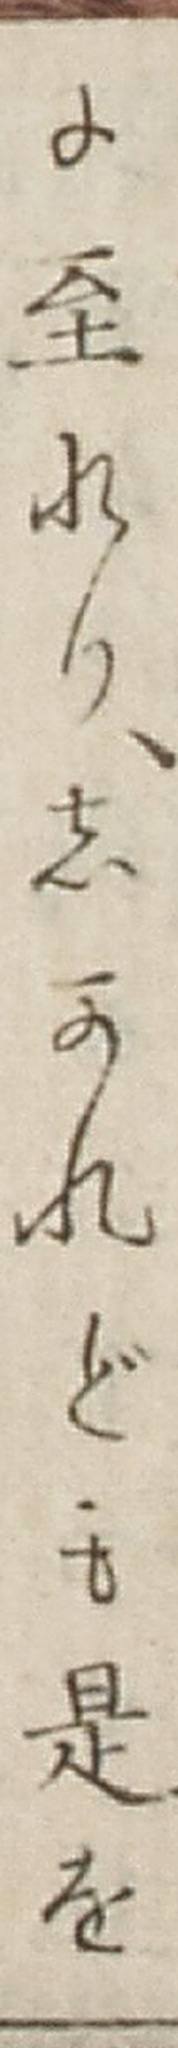に至れり、しかれども是を
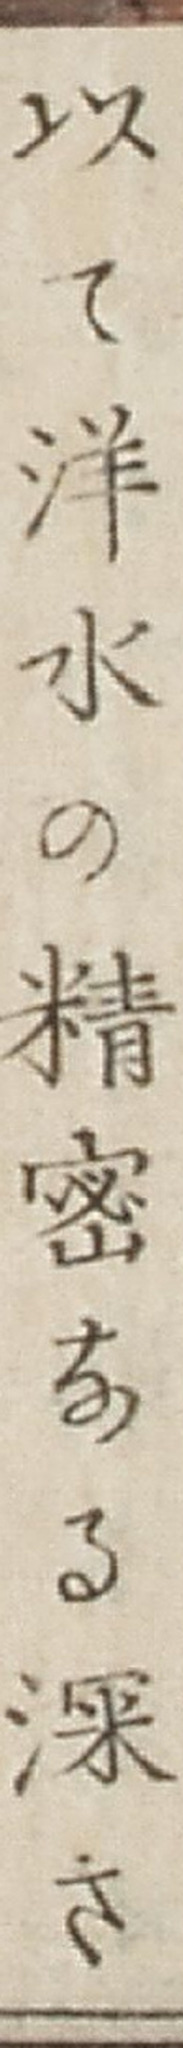以て洋水の精密なる深さ
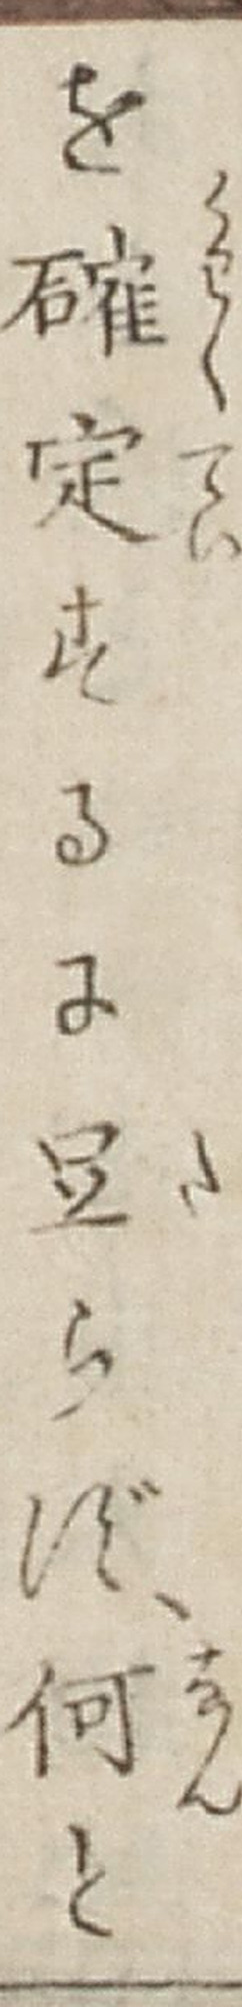を確定するに足らず、何と
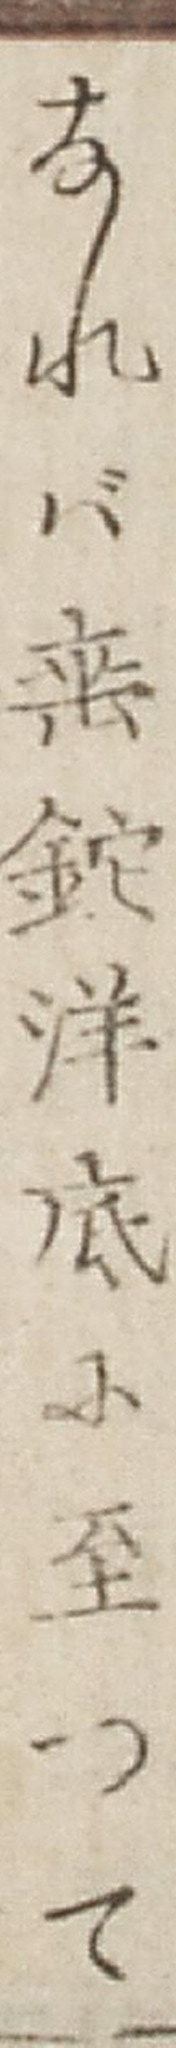なれば垂鉈洋底に至つて
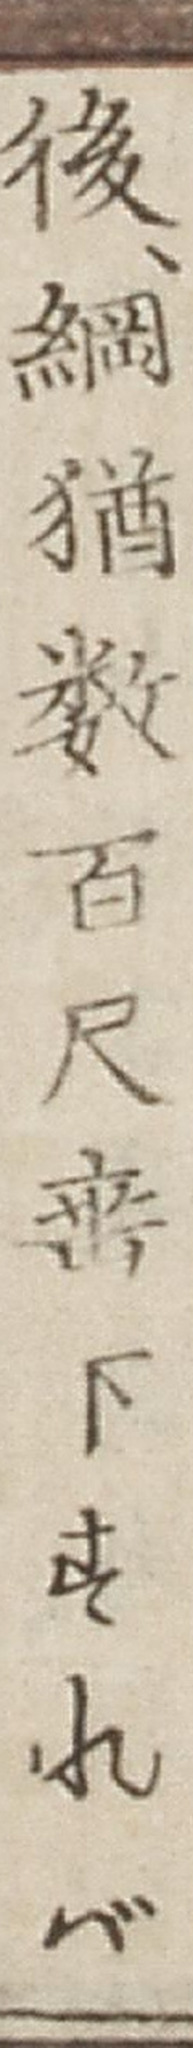後、綱猶数百尺垂下すれば
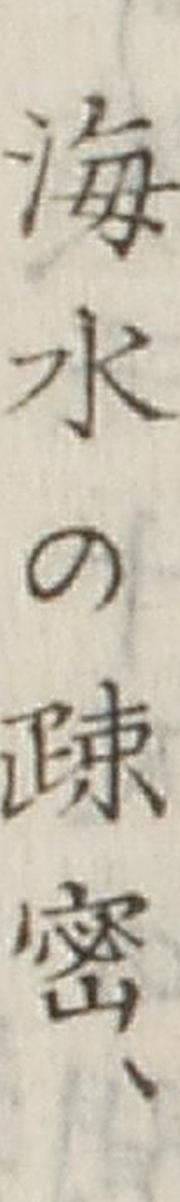海水の踈密、
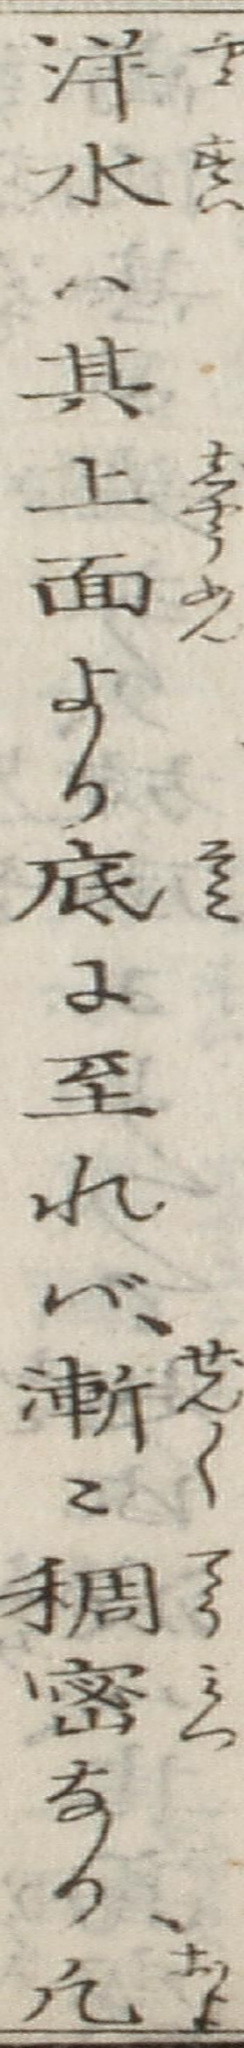洋水は其上面より底に至れば、漸〻稠密なり、凡
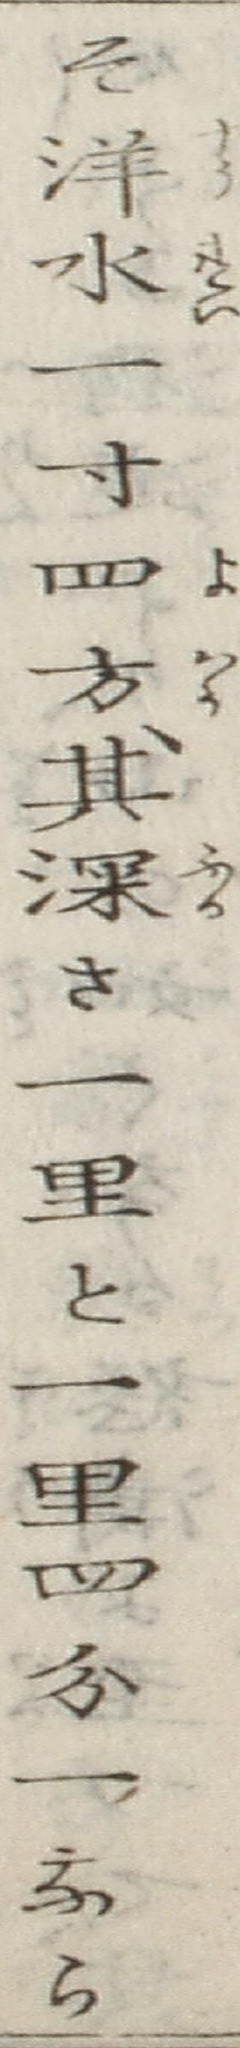そ洋水一寸四方、其深さ一里と一里四分一なら
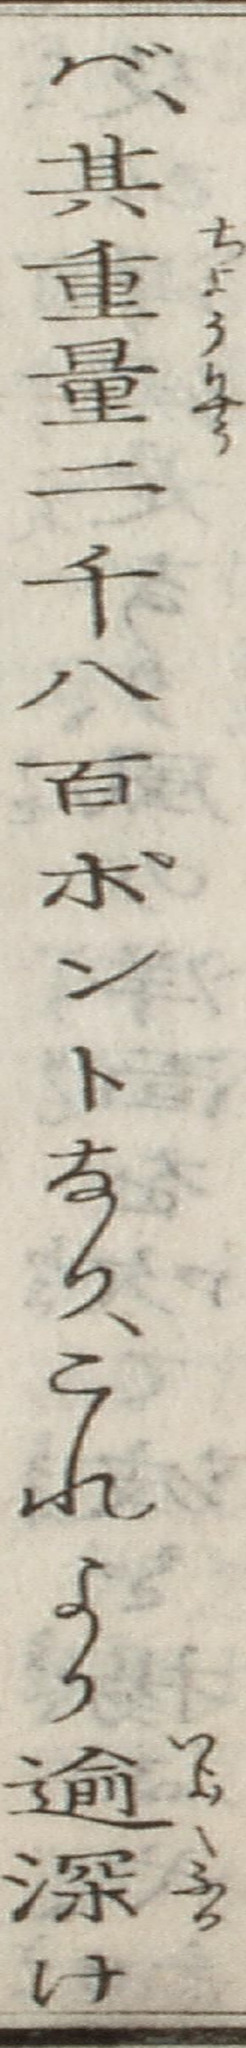ば、其重量二千八百ポンドなり、これより愈深け
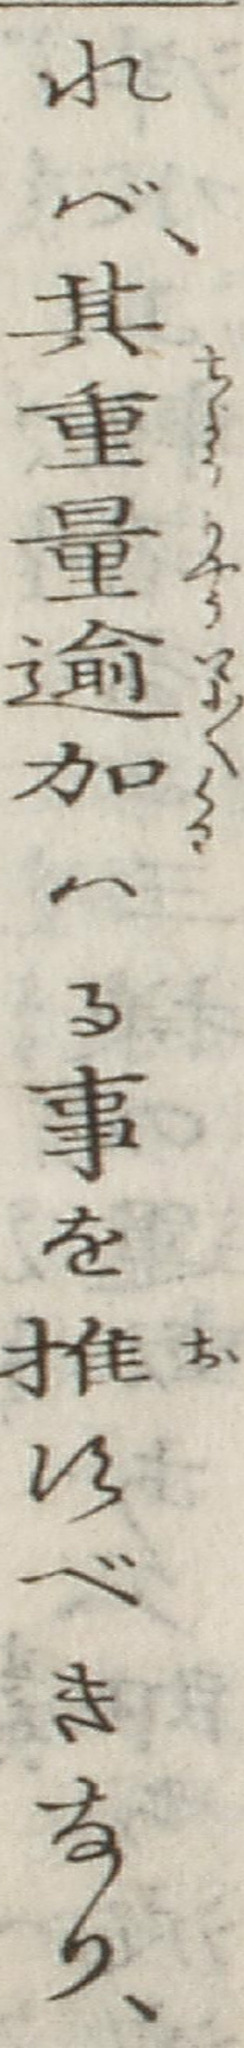れば、其重量愈加はる事を推すべきなり、
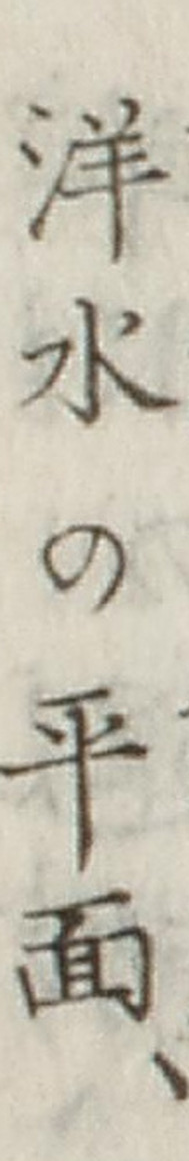洋水の平面、
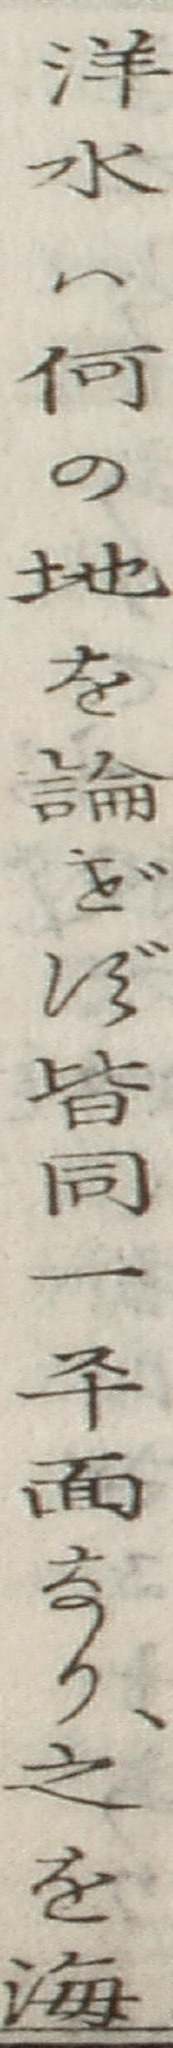洋水は何の地を論ぜば、皆同一平面なり、之を海
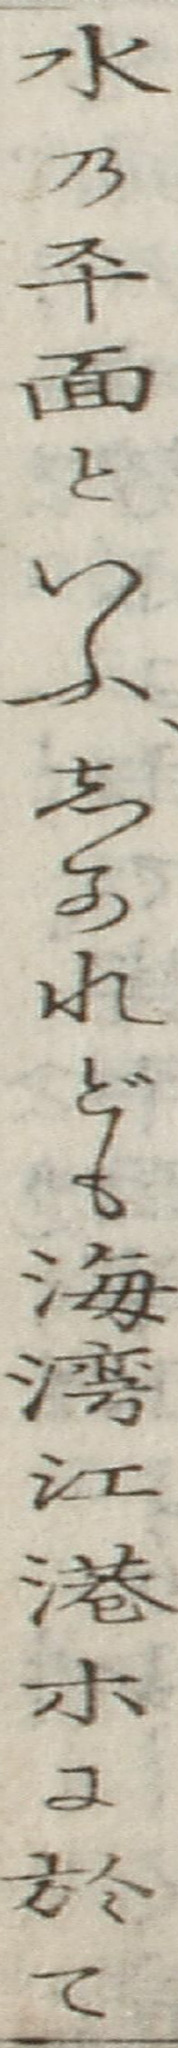水乃平面といふ、しかれども海湾江港等に於て

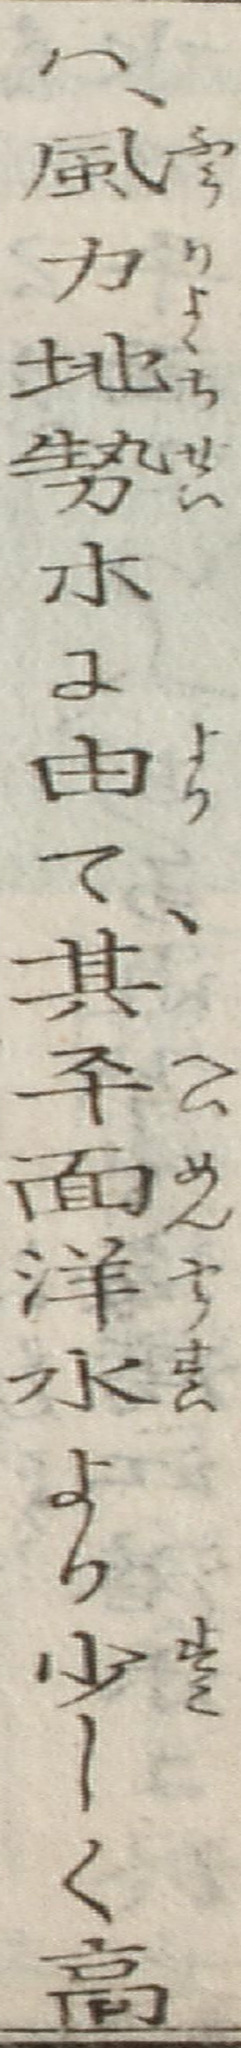は、風力地勢等に由て、其平面洋水より少しく高
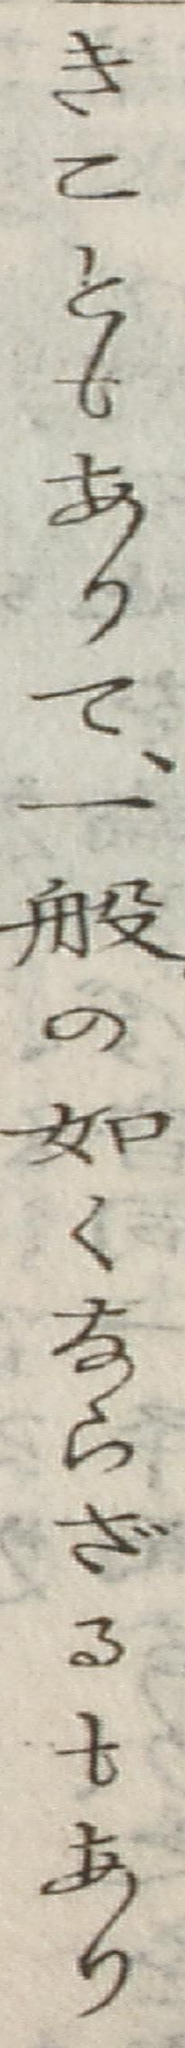きこともありて、一般の如くならざるもあり
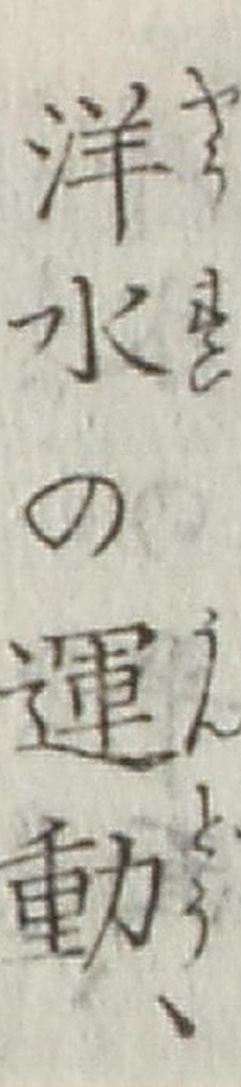洋水の運動、
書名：訓蒙　天然地理學　中
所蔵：東京大学地震研究所図書室 Earthquake Research Institute Library, The University of Tokyo, JAPAN
